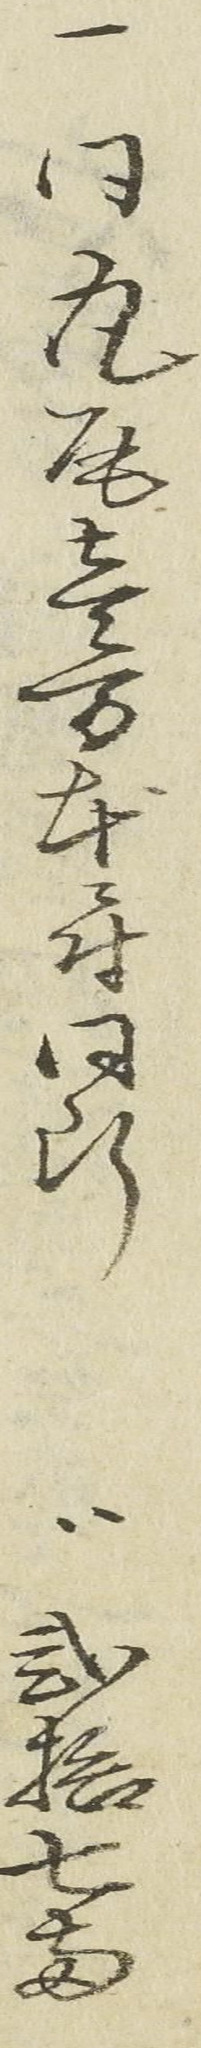一同丸瓦壱万本ニ付同断同弐拾七両
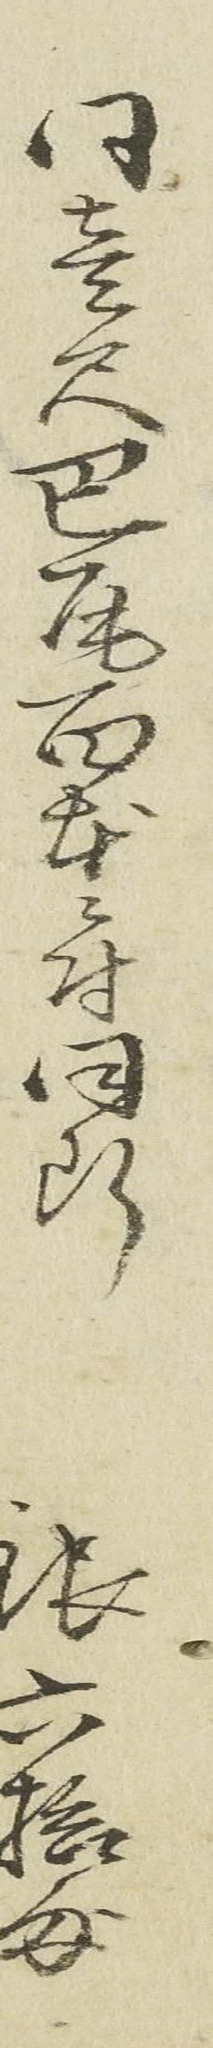一同壱尺巴瓦百本ニ付同断銀六拾匁
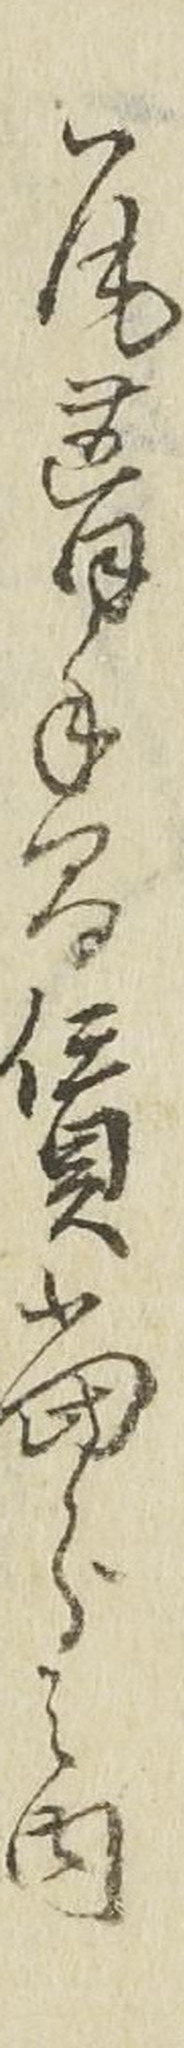瓦葺手間賃当分之内
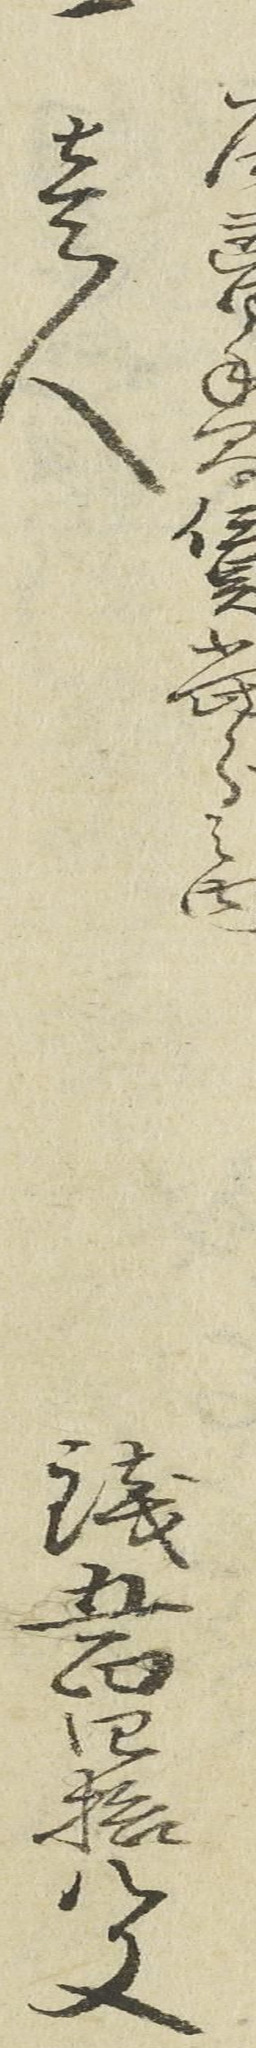一壱人銭五百四拾八文

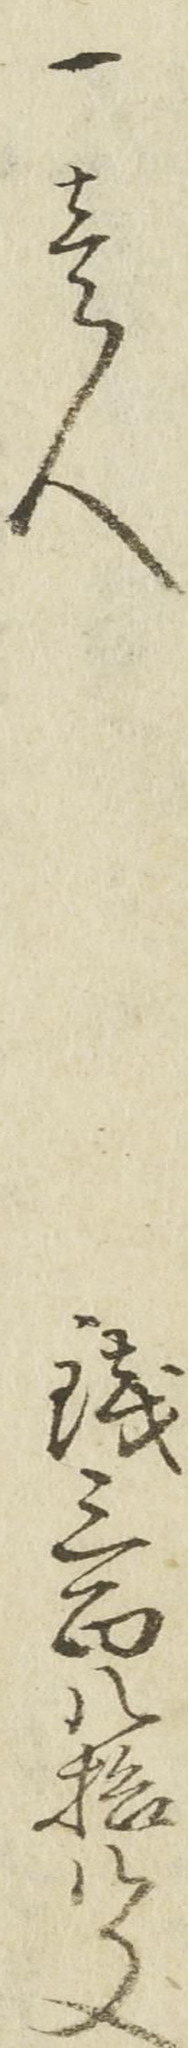一壱人銭三百八拾八文
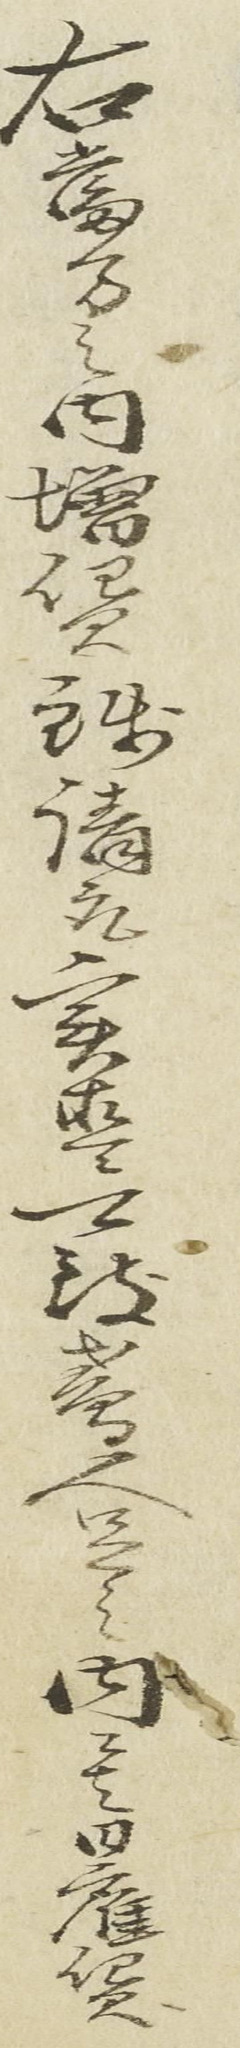右当方之内増賃銭受請取実直ニ可致鳶人足之内ニは日雇賃
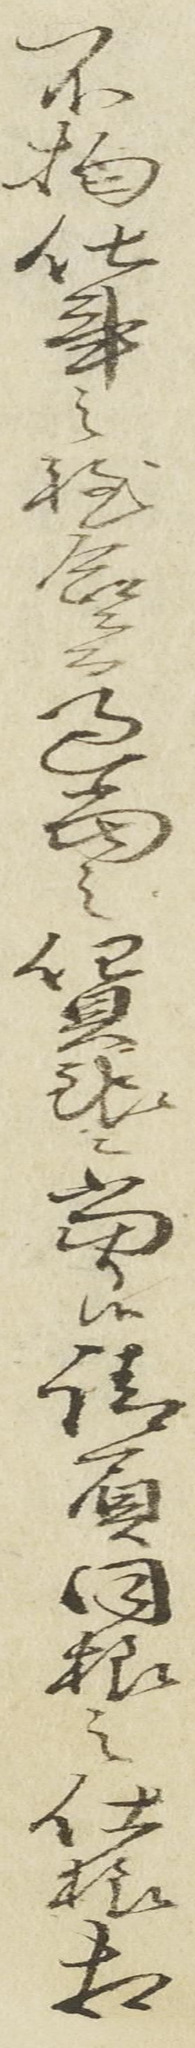不拘仕事之程合ニ而過当之賃銀二當り候請負同様の仕様相
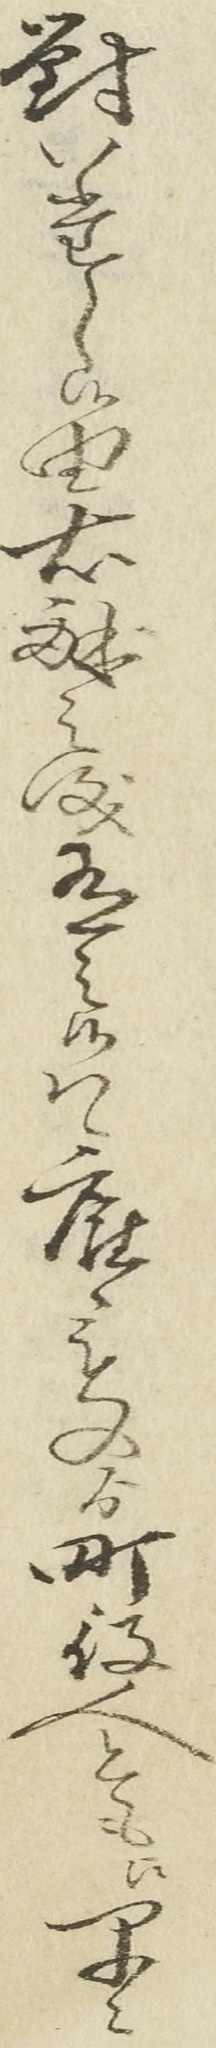対いたし候由右躰之儀有之候ハゝ雇候ものゟ町役人とも得早々
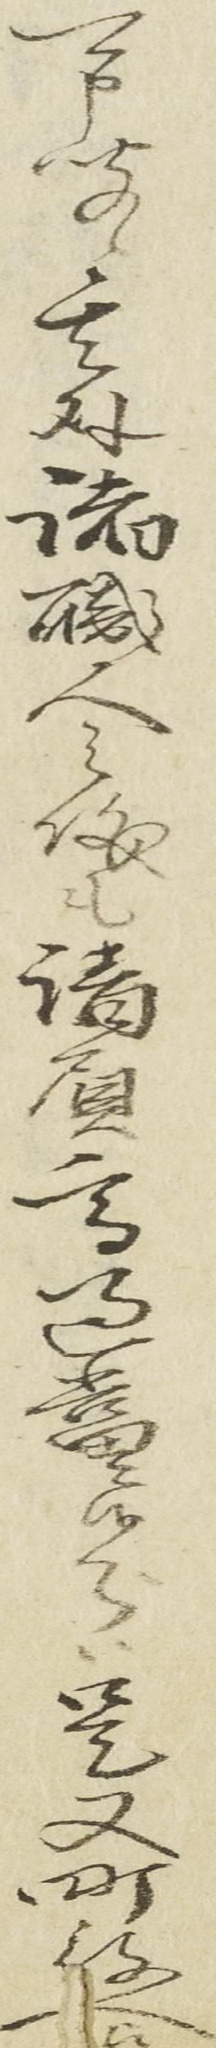可申聞候其の外諸職人之儀も請負高過当二候ハゝ是又町役人え
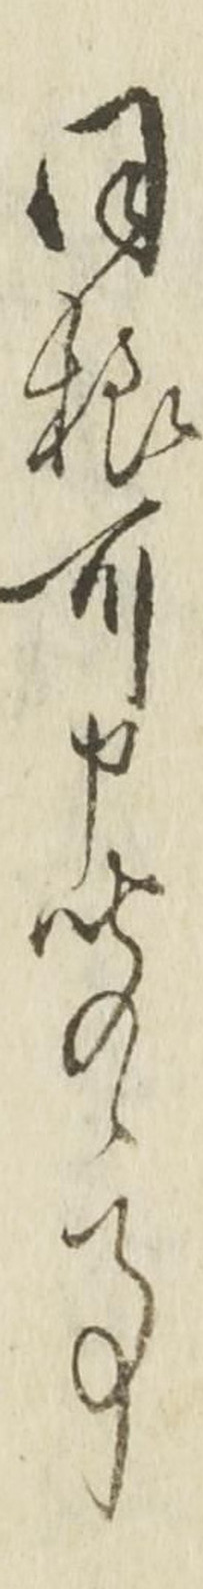同様可申聞候事
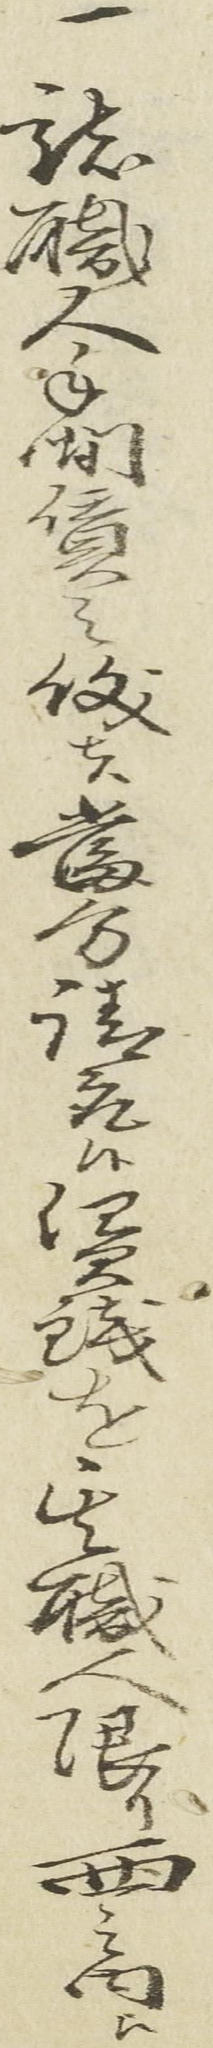一諸職人手間賃之儀は当方請取候賃銭を其職人限り西之内え
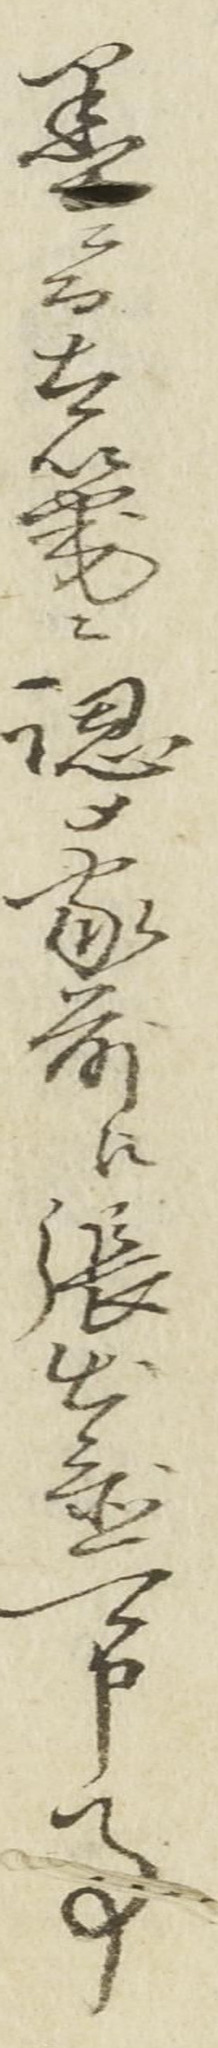墨二而太筆二認メ家前え張出置可申事
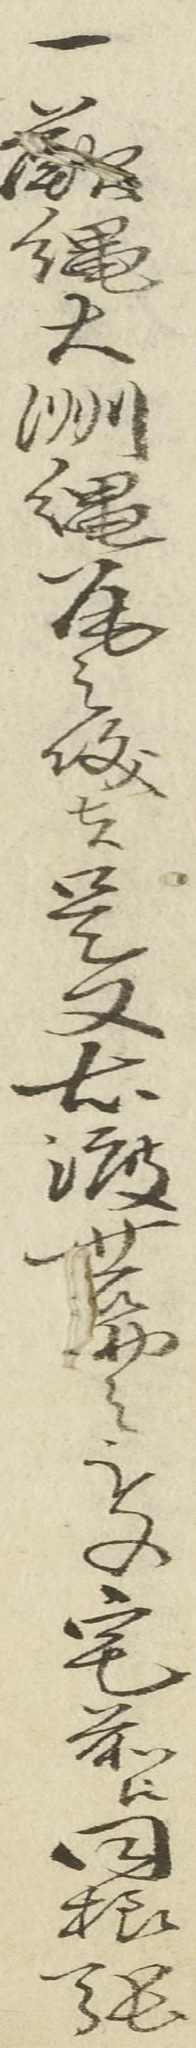一蕨縄大洲縄瓦之儀は是又右渡世筋之もの宅前え同様張
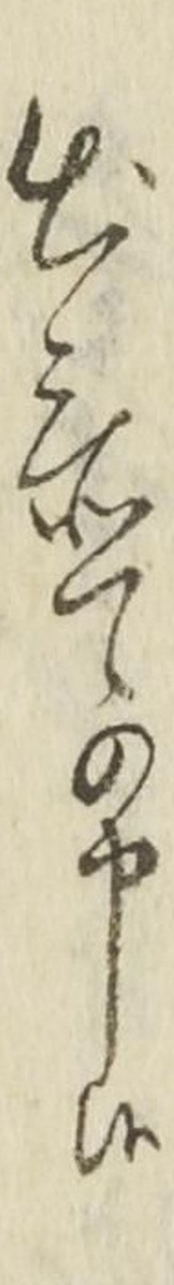出置可申候
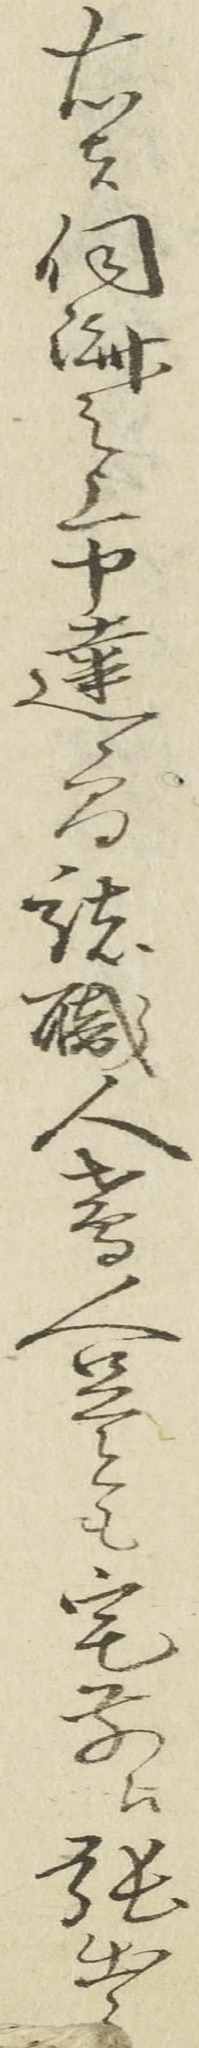右は伺済之上申達候間諸職人鳶人足とも宅前え張出候
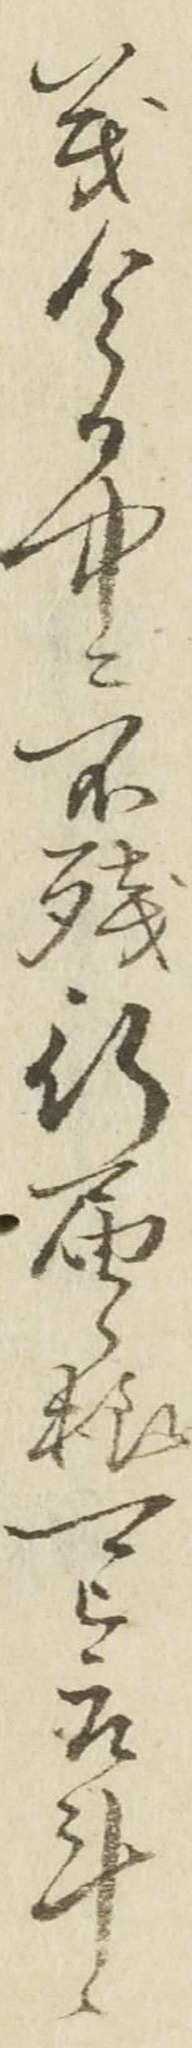義今日中二不残行届候様可被取斗候
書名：安政二乙卯年十月二日大地震之事
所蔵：東京大学地震研究所図書室 Earthquake Research Institute Library, The University of Tokyo, JAPAN
